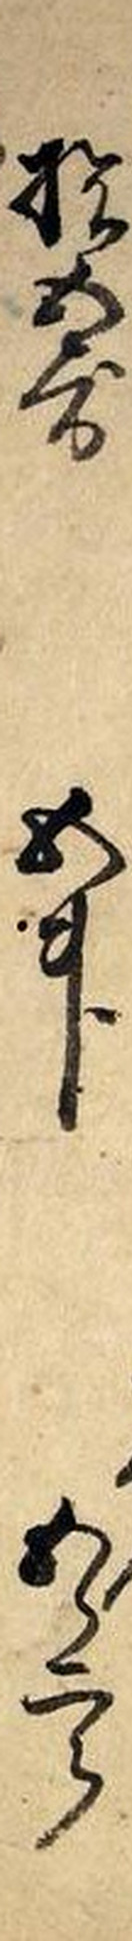拾五歩五升五郎二郎
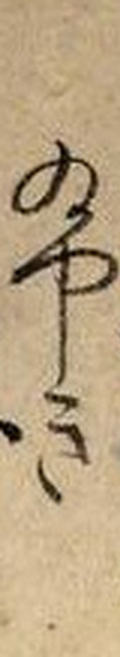ゐやしき
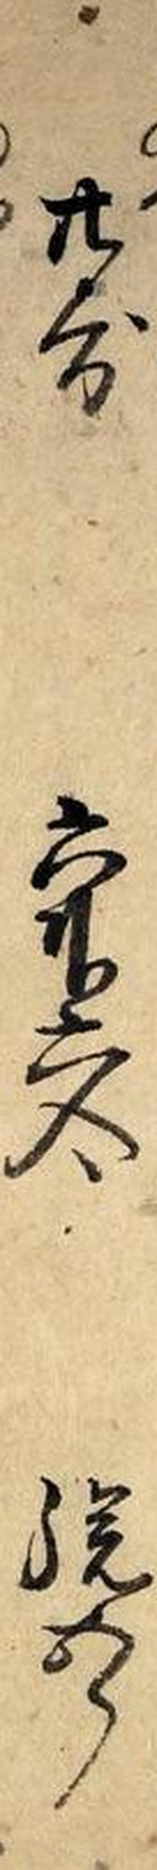廿歩六升六合孫五郎
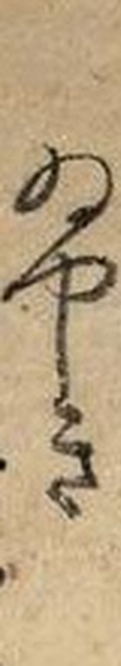ゐやしき
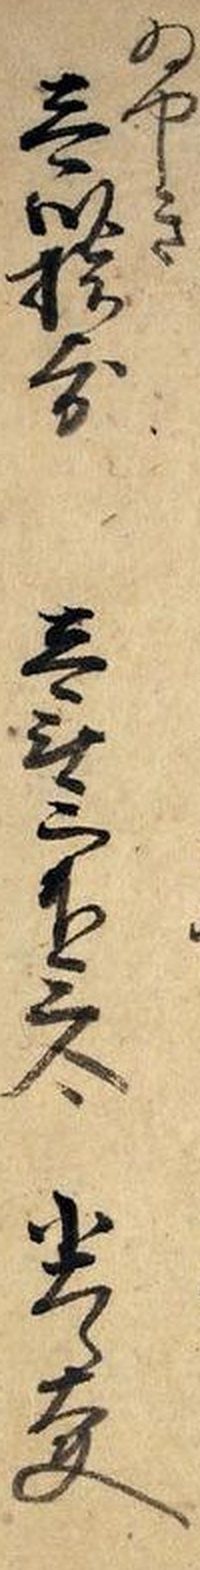壱畝拾歩壱斗三升三合小大郎大夫
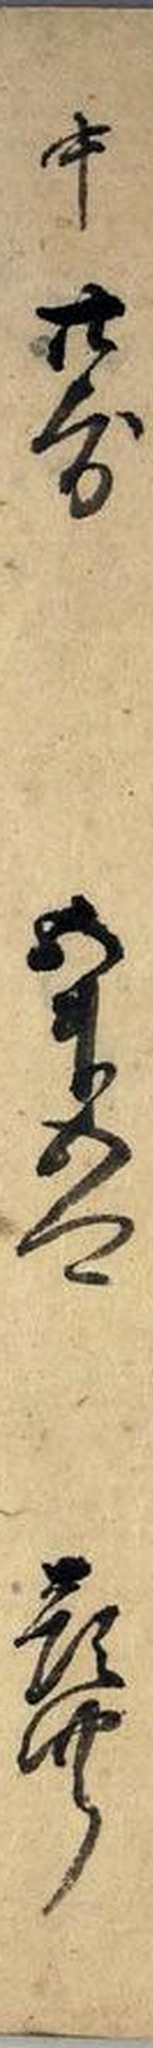中廿歩五升五合彦四郎
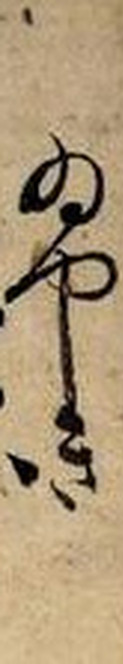ゐやしき
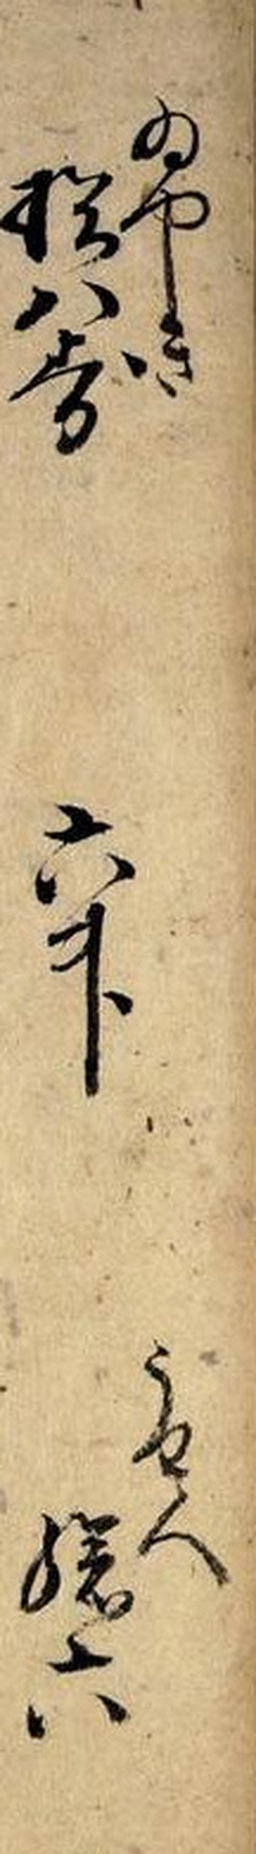拾八歩六升孫六
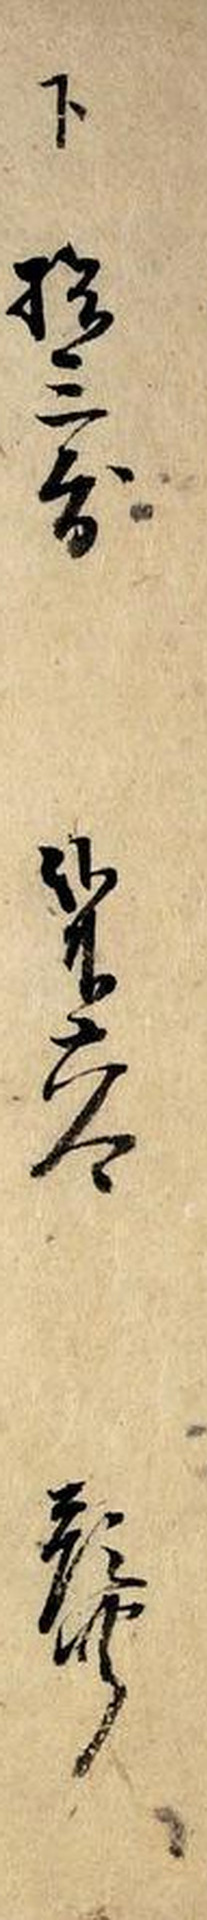下拾三歩弐升六合彦四郎
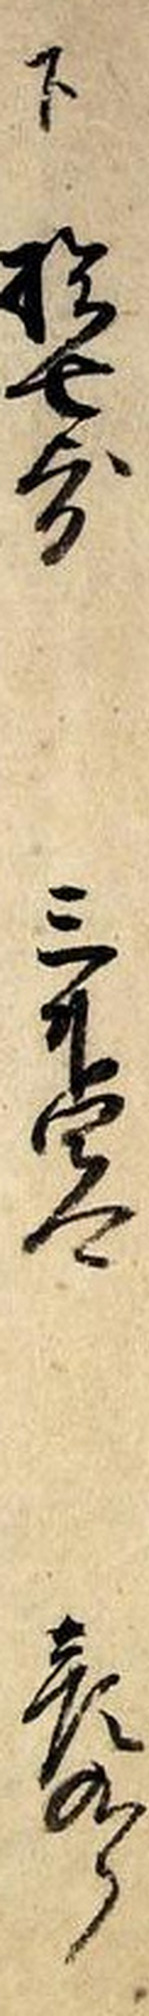下拾七歩三升四合彦九郎
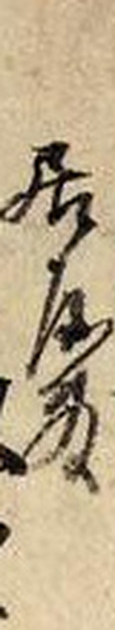居屋敷
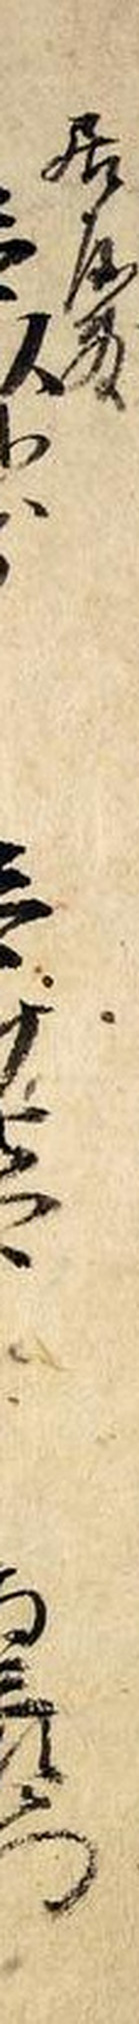壱畝弐歩壱斗七合与三左衛門
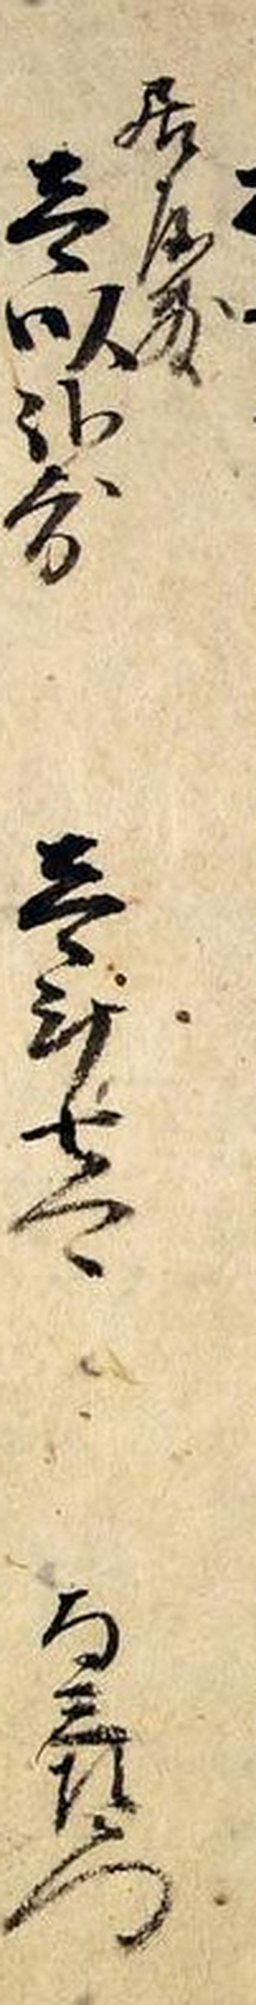壱畝弐歩壱斗七合与三左衛門
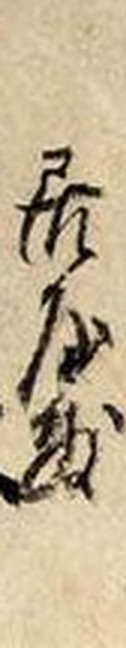居屋敷
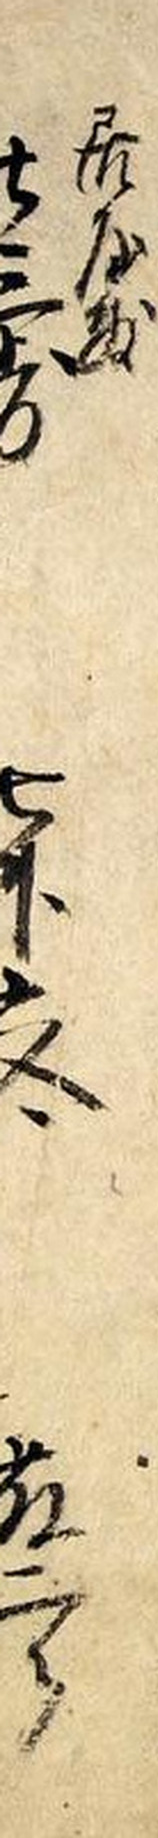廿三歩七升六合藤二郎
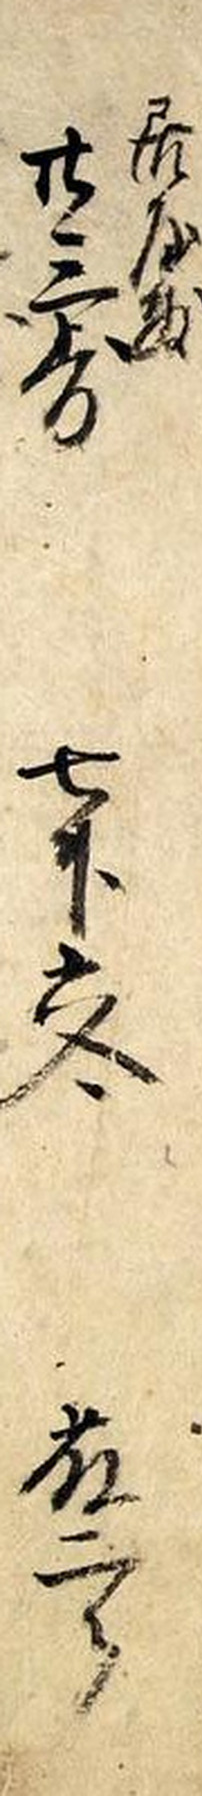廿三歩七升六合藤二郎
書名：若州三方郡之内世久見浦御検地帳（世久見浦検地帳写）
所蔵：福井県文書館 Fukui Prefectural Archives
